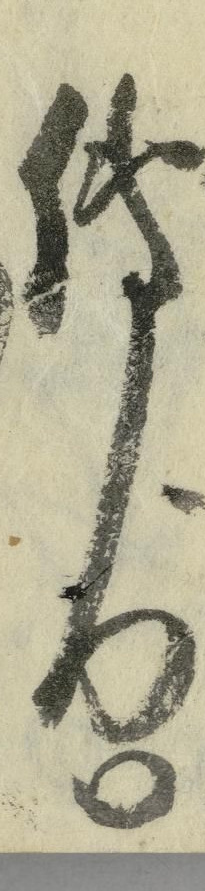小右衛門
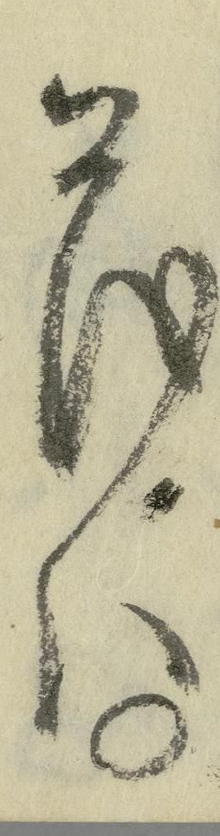小右衛門
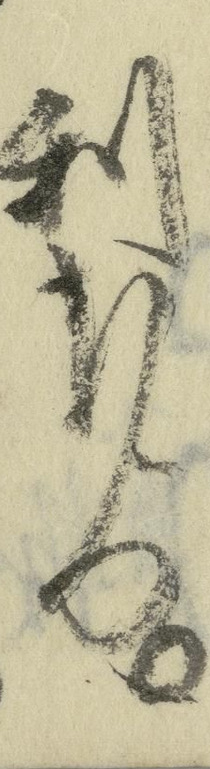利左衛門
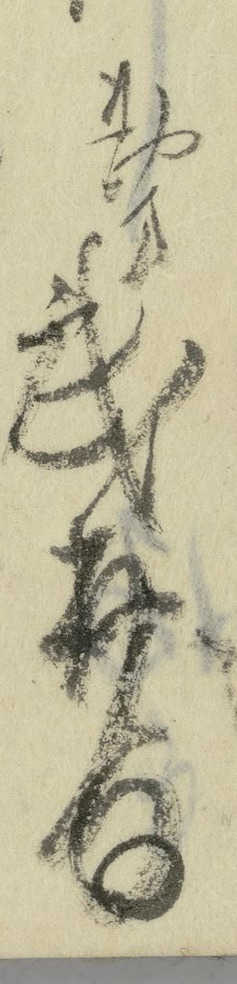小右衛門
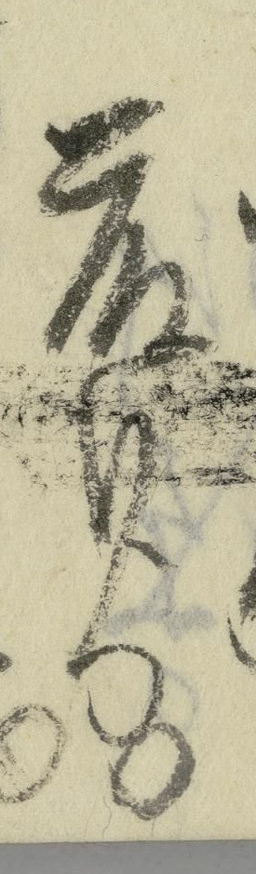藤左衛門
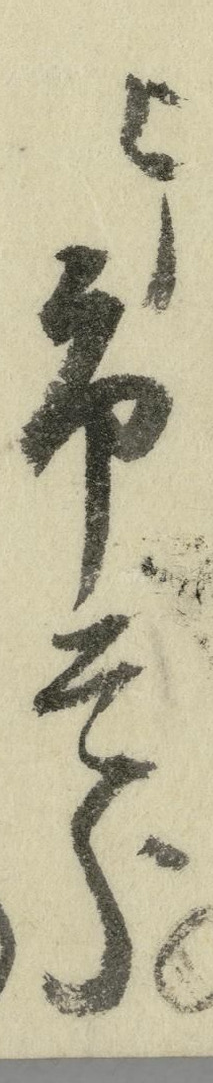嘉兵衛
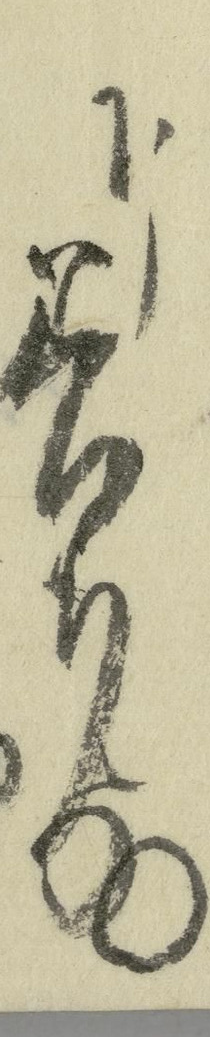善右衛門
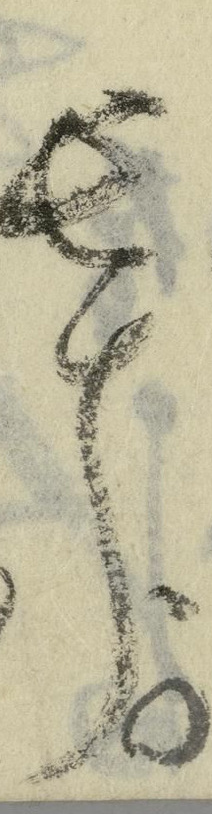長十郎
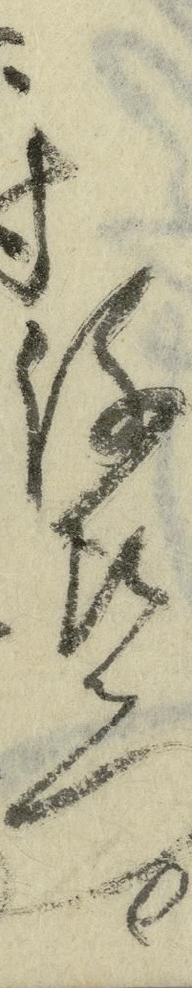弥左衛門
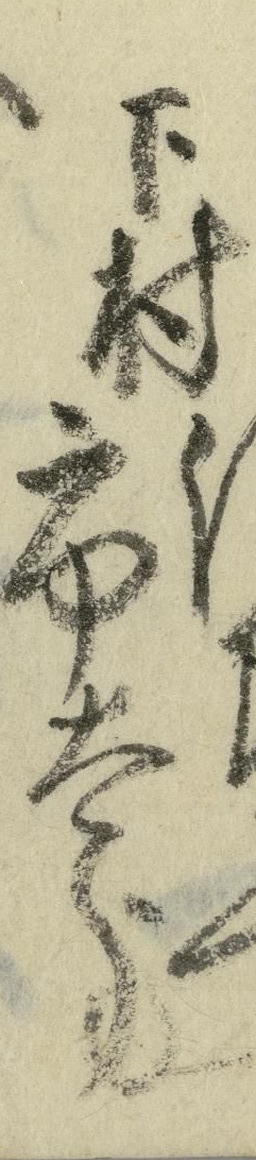市太郎
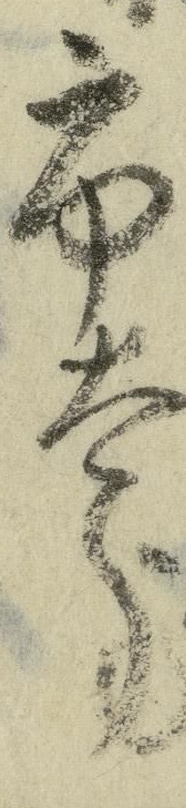市太郎

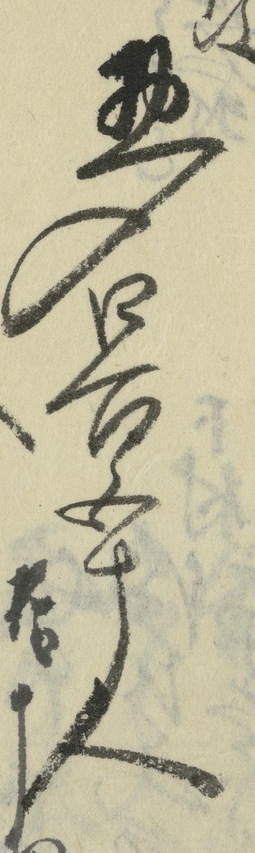惣〆四百五十人
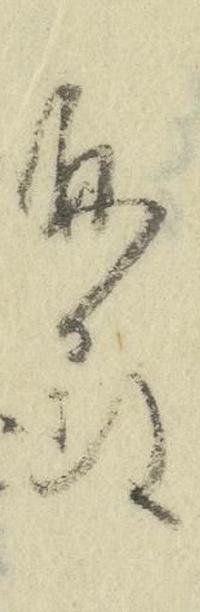晦日朝
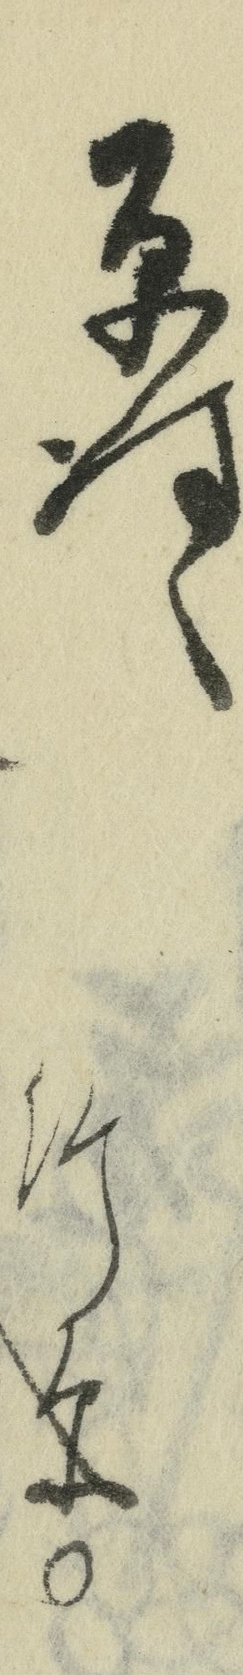原河へ
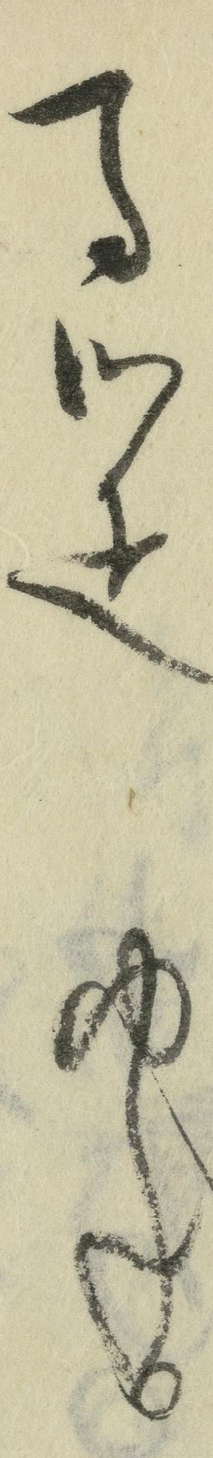馬弐疋竹原
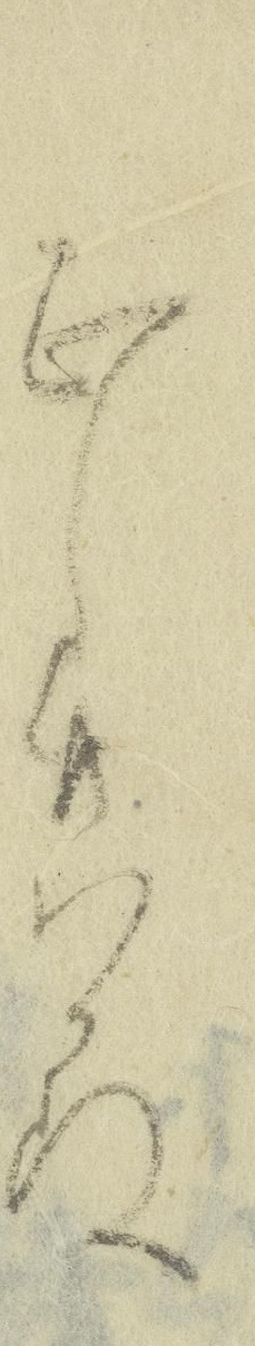正月廿八日朝
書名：天明淺間噴火ニ関スル書類
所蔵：東京大学地震研究所図書室 Earthquake Research Institute Library, The University of Tokyo, JAPAN
